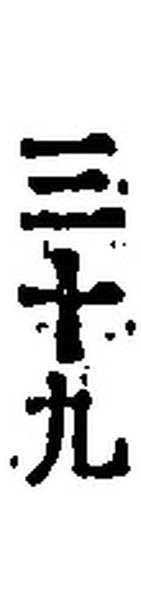三十九

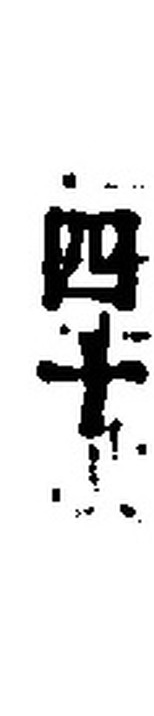四十一
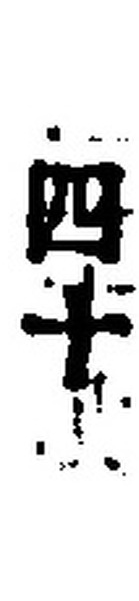四十一
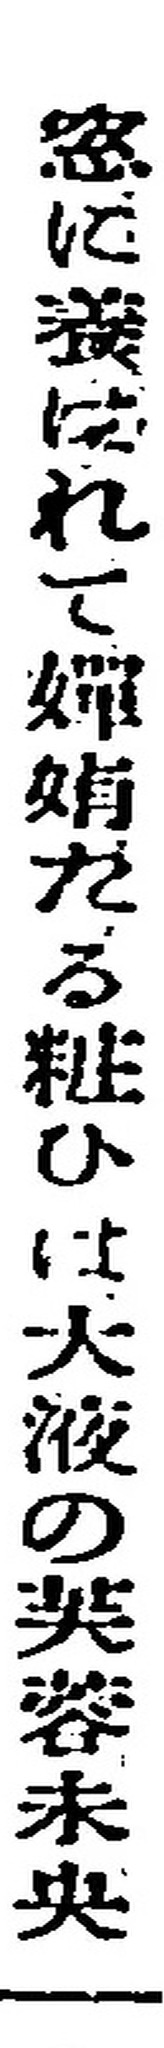窓に養はれて嬋娟たる粧ひは大液の芙蓉未央
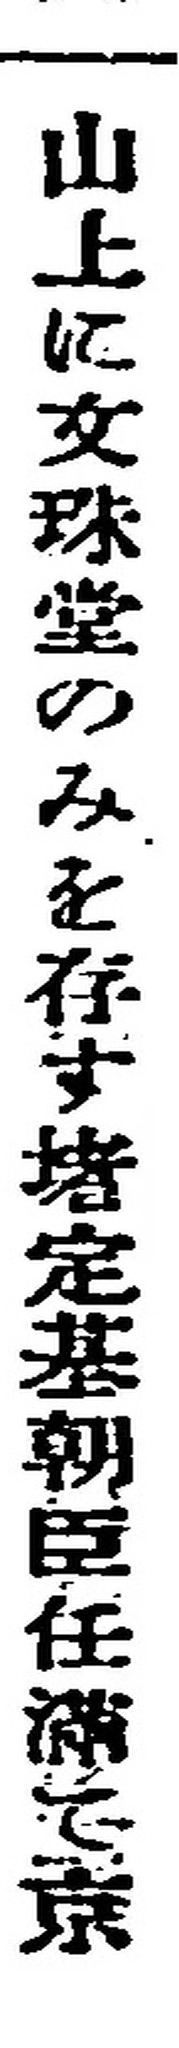山上に文珠堂のみを存す堵定基朝臣任満て京
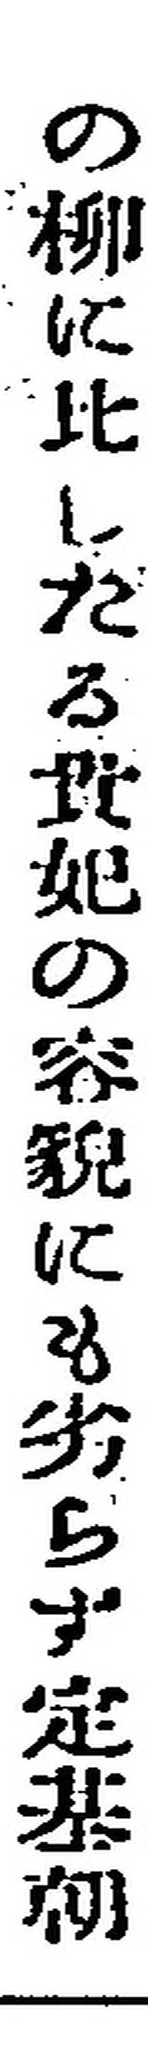の柳に比したる貴妃の容貌にも劣らず定基朝
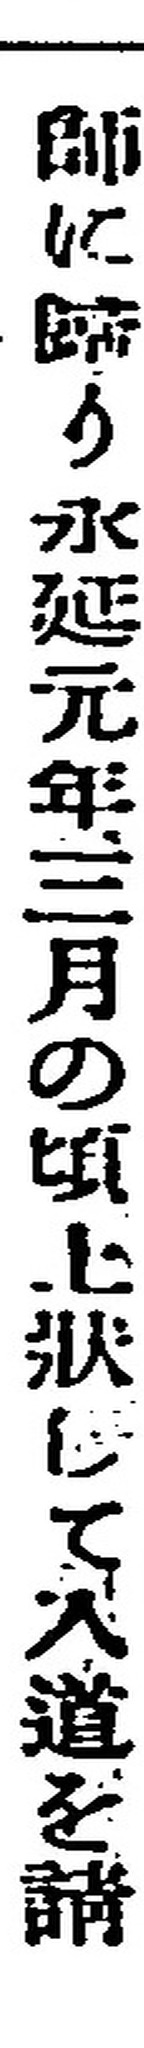師に帰り永延元年三月の頃上状して入道を請
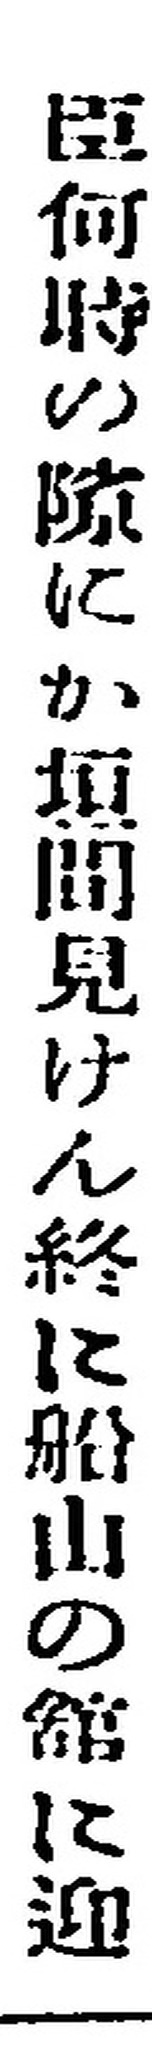臣何時の隙にか垣間見けん終に船山の舘に迎
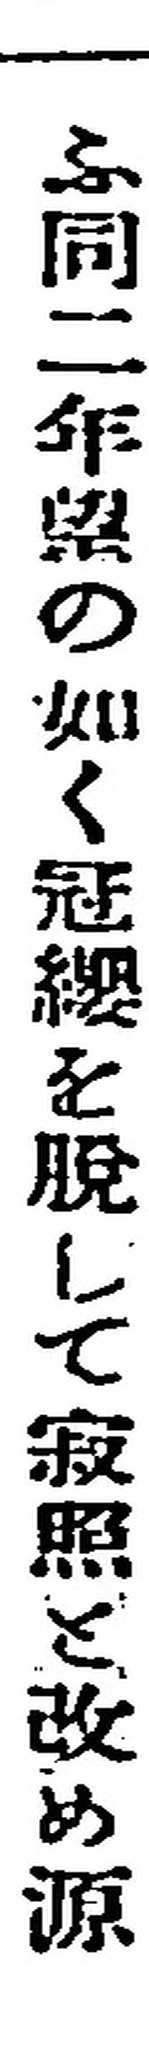ふ同二年望の如く冠纓を脱して寂照と改め源
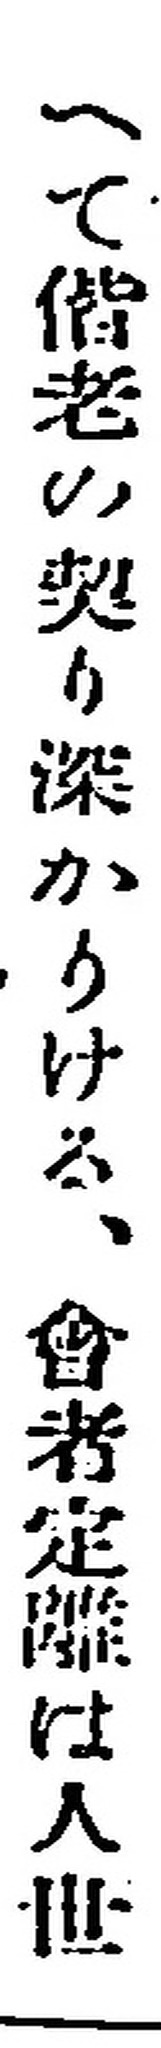へて偕老の契り深かりける、会者定離は人世
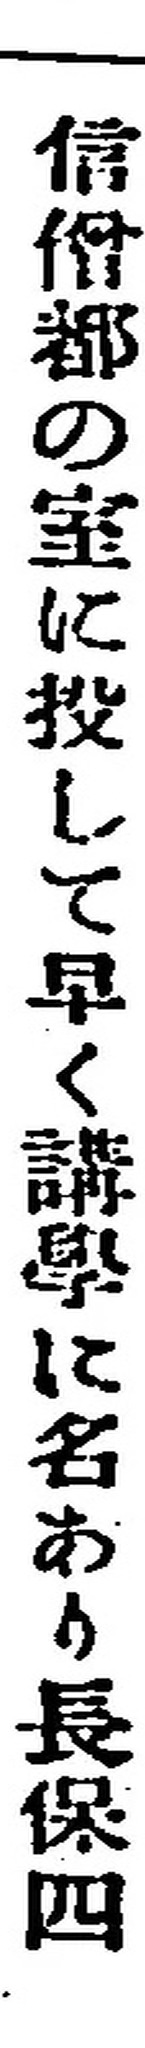信僧都の室に投して早く講学に名あり長保四
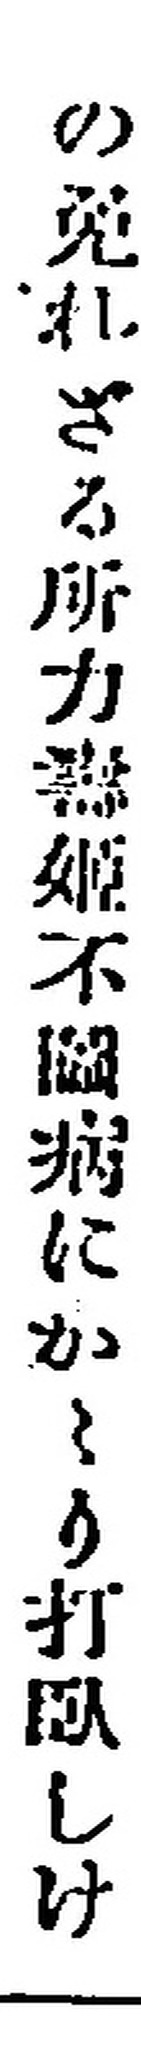の免れざる所力寿姫不病にかゝり打臥しけ
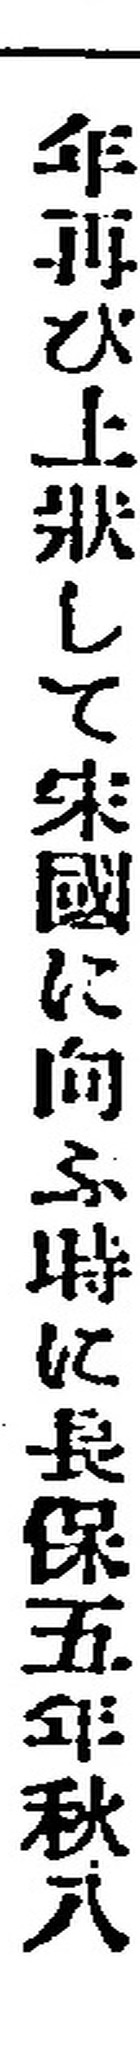年再び上状して宋国に向ふ時に長保五年秋八
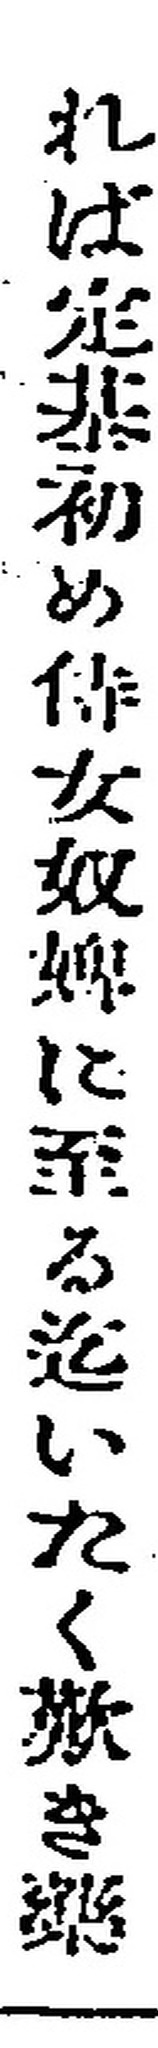れば定基初め侍女奴婢に至る迄いたく歎き薬
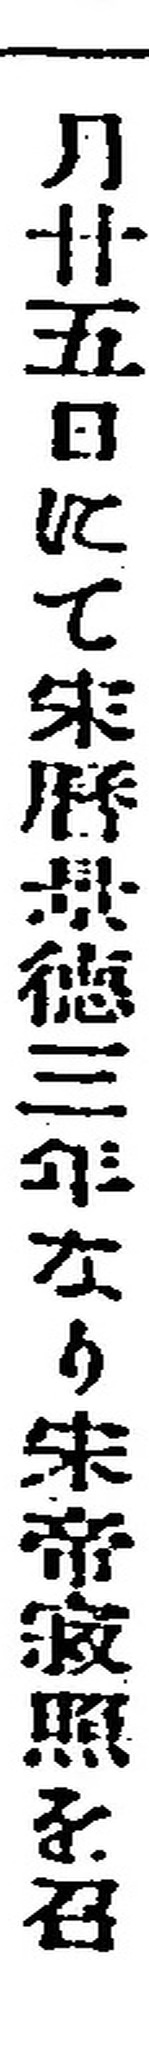月廿五日にて宋暦景徳三年なり宋帝寂照を召
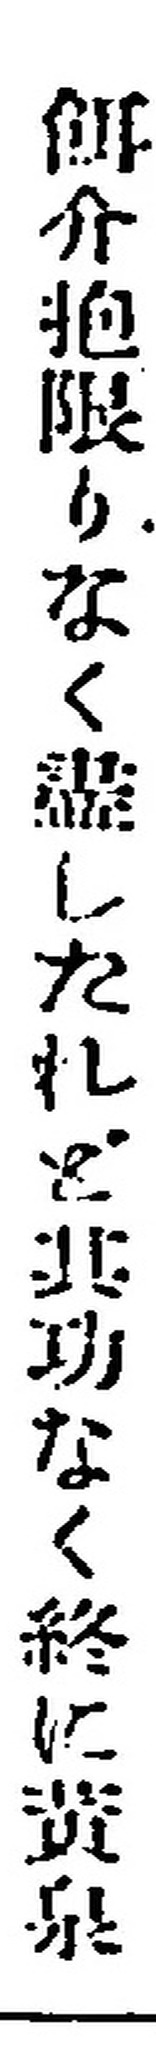餌介抱限りなく尽したれど其功なく終に黄泉
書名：東参名勝案内
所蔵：国立国会図書館 National Diet Library, JAPAN
